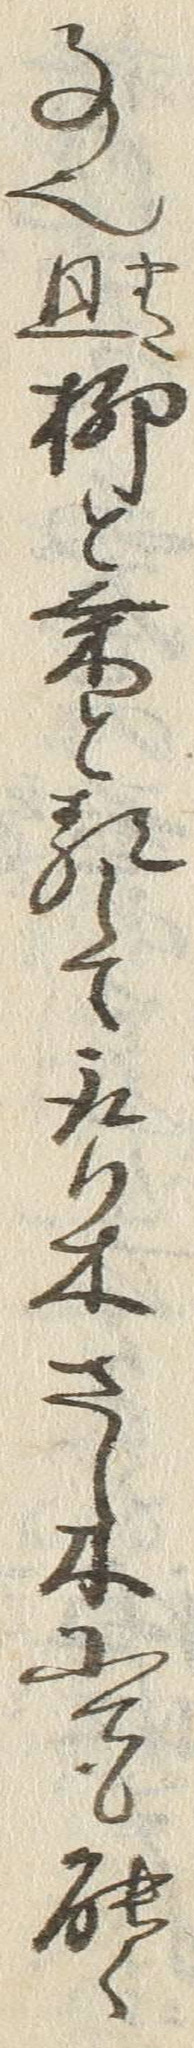事也且柳と桑と類して取り木さし木尓ても能く
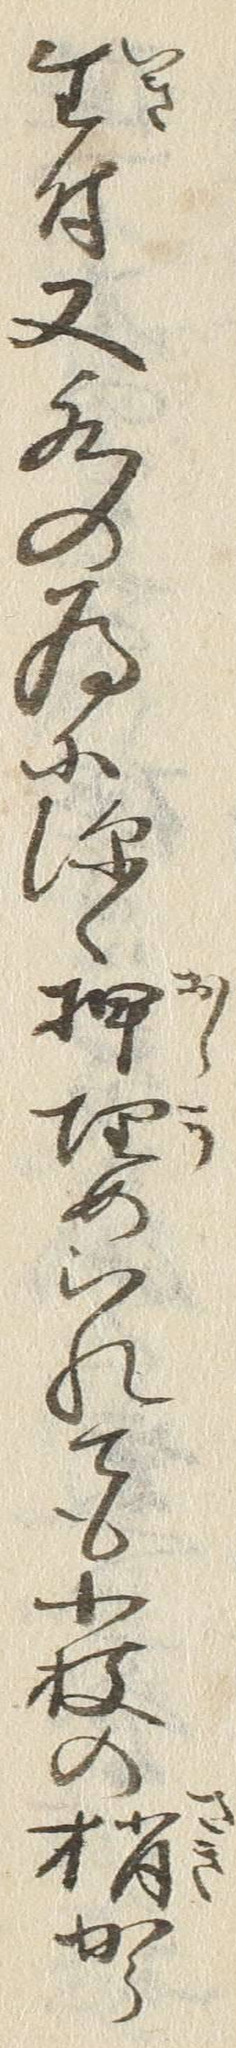生付又水の為尓深く押埋められても小枝の梢から
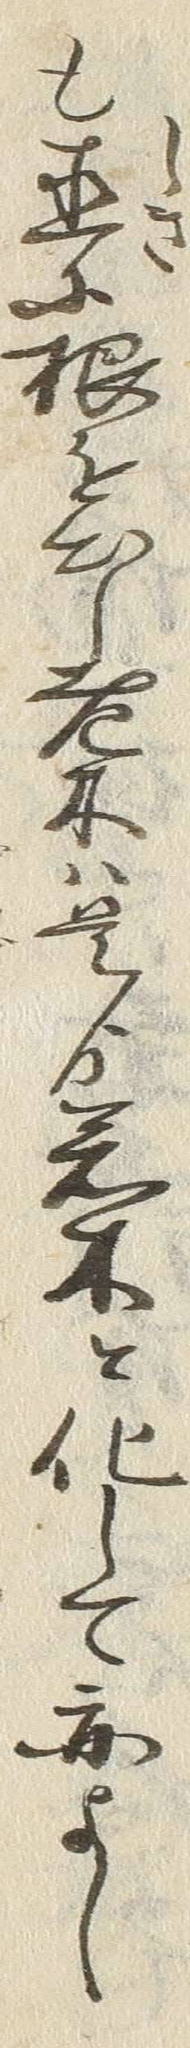も直尓根を出し老木は是ゟ若木と化して亦よし
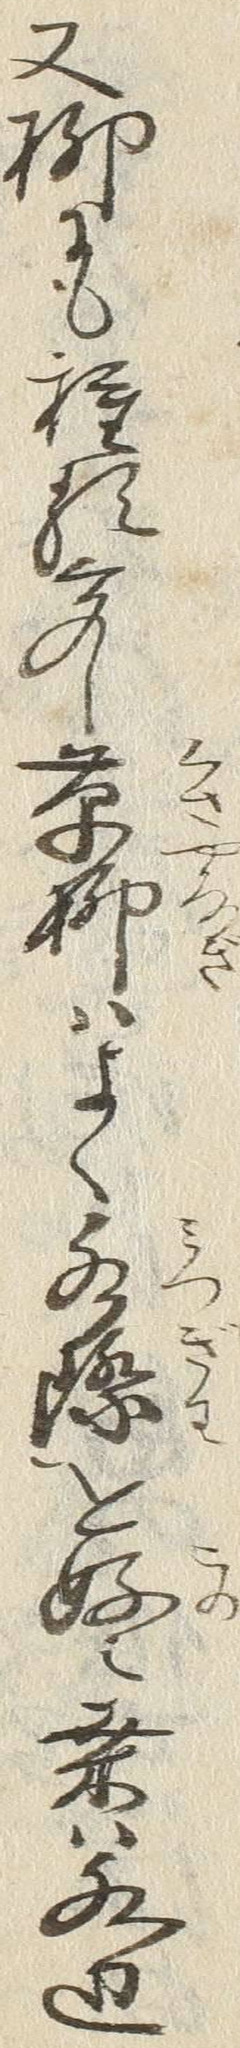又柳尓も種類多し草柳はよく水際を好み桑は水辺
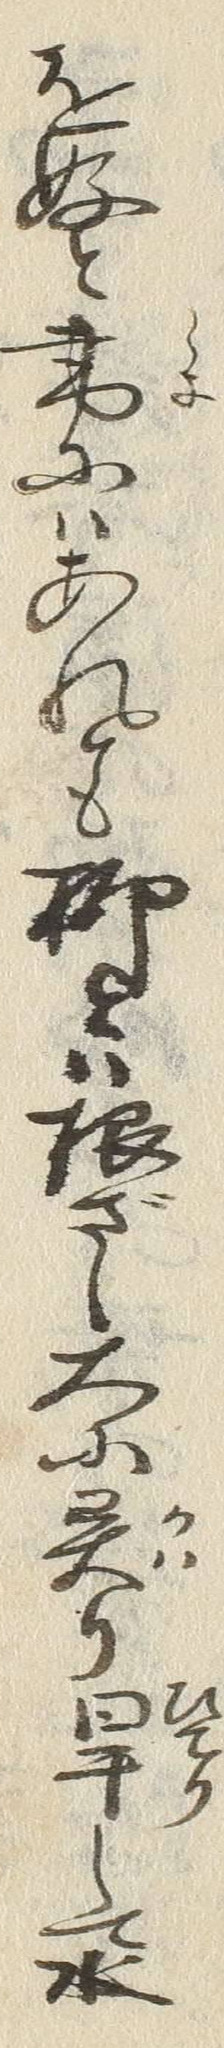を好と書尓はあれとも柳とは根ざし大尓異り旱して水
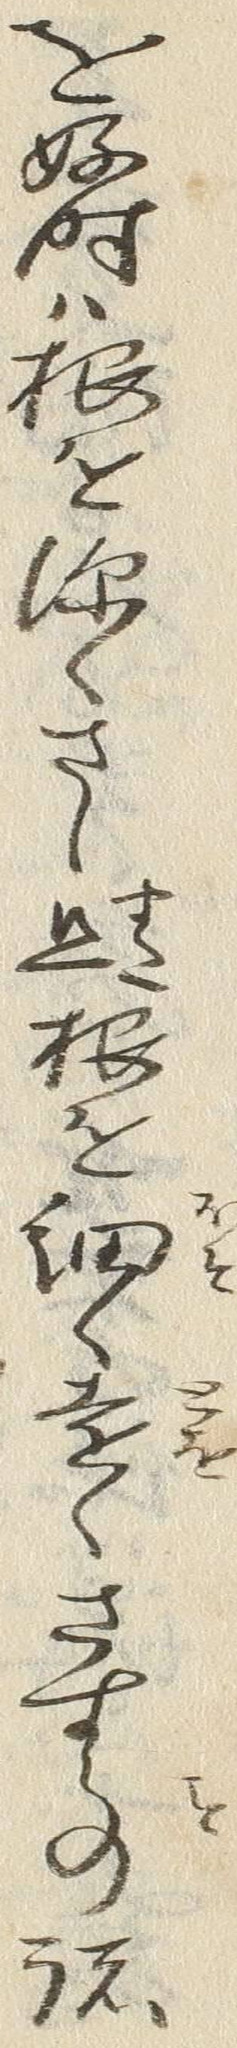を好時は根を深くさし且根を細く遠くさす事諸
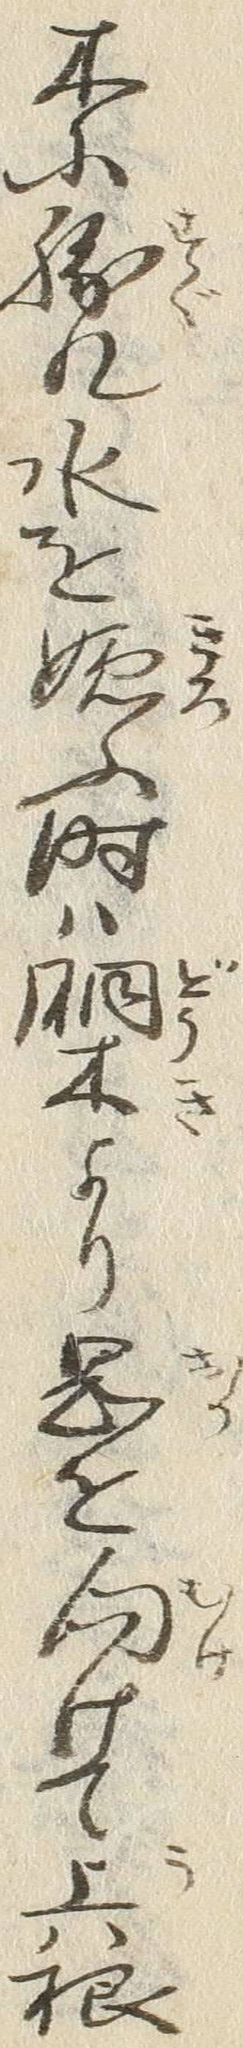木尓勝れ水を嫌ふ時は胴木より岡を向けて上は根
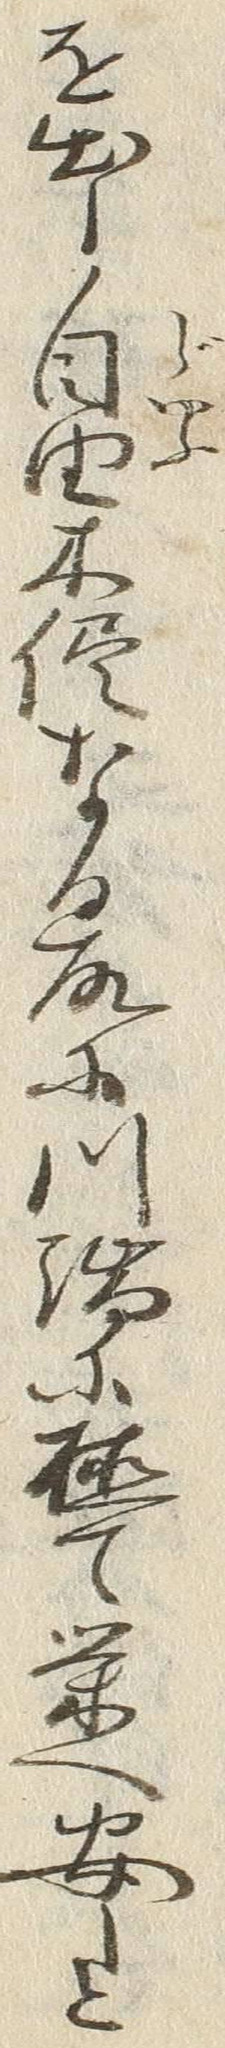を出し自由木侭なる故尓川端尓植て栄へ安しと
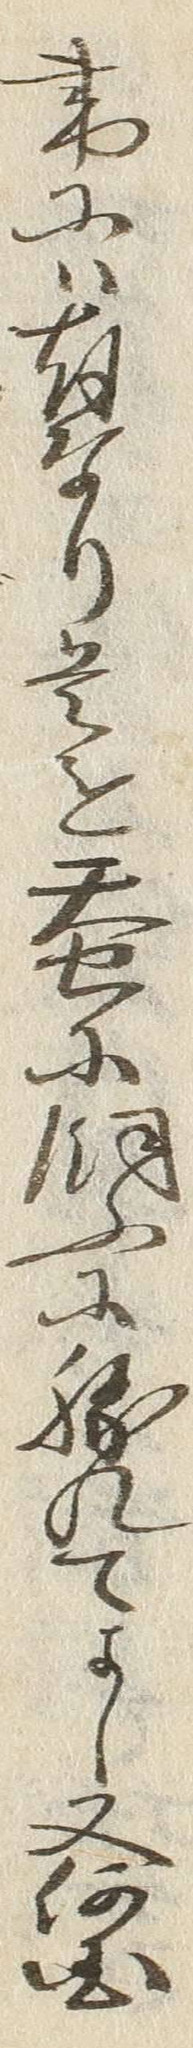書尓は有なり是を蚕尓飼ふ尓勝れてよし又何國
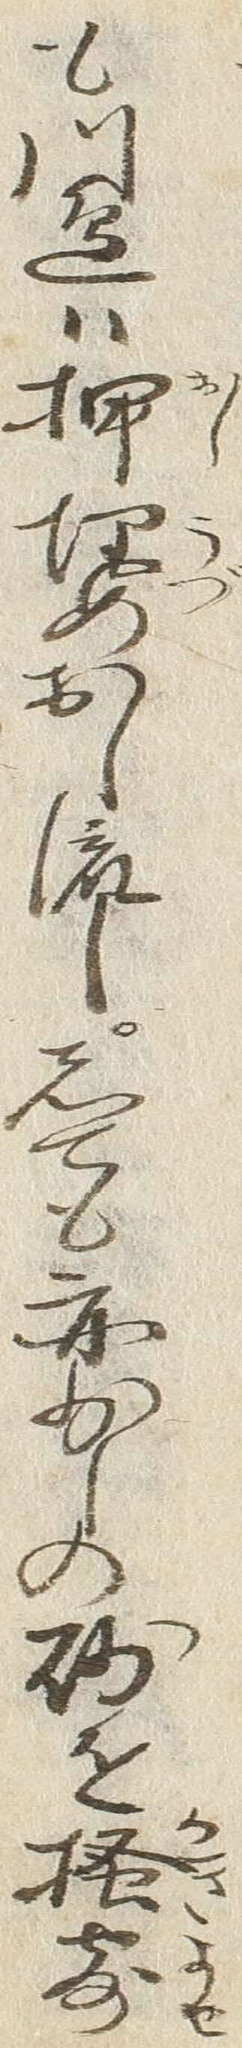も川邊は押埋め出し流し。志ても亦少しの砂を掻寄
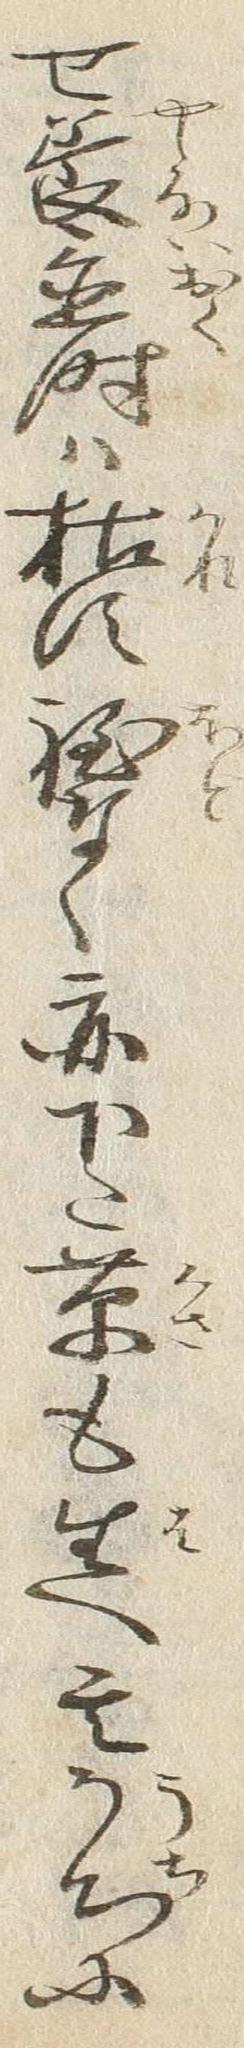せ養置時は枯須程なく亦下た草も生へ其うち尓
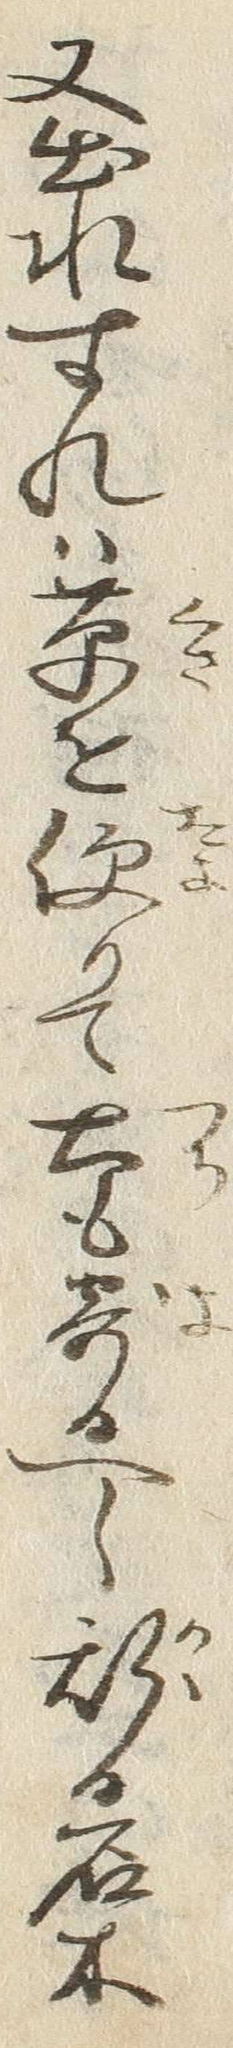又出水すれは草を便りて土も寄るへし斯る名木
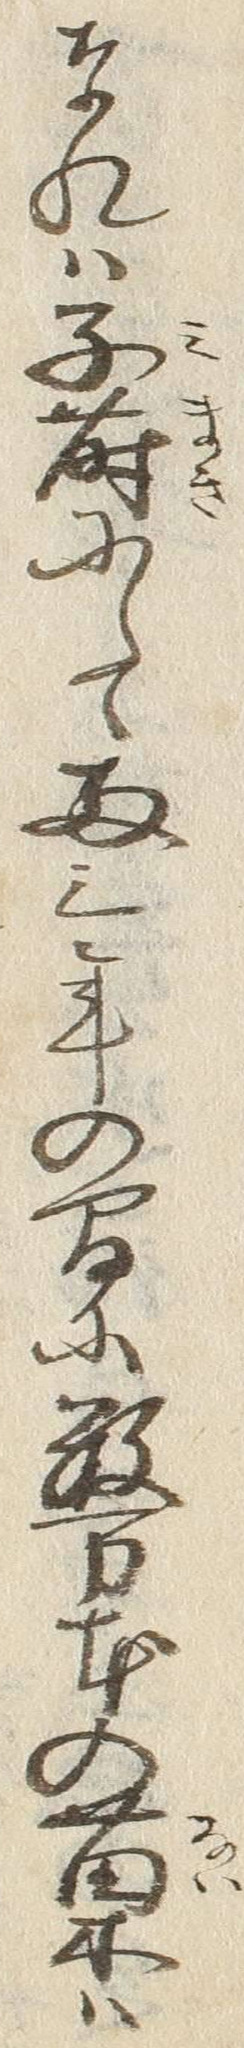なれは子蒔尓して両三年の間尓数万本の苗木は
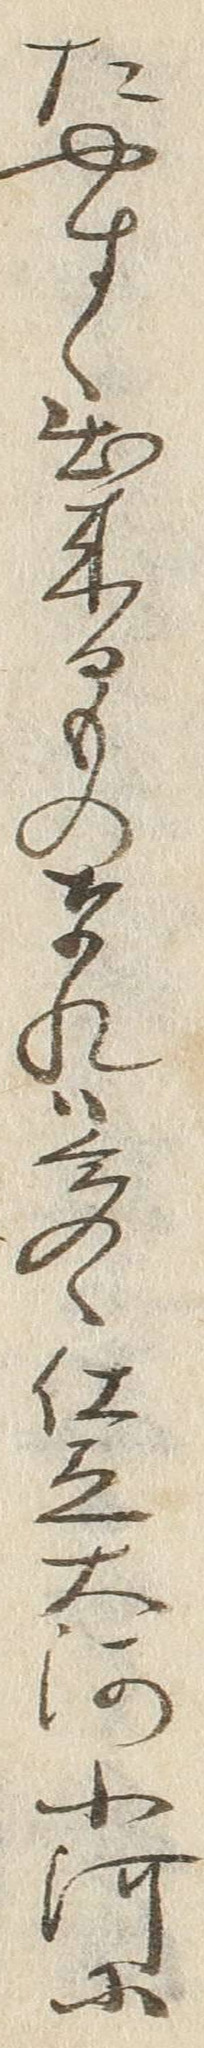たやすく出来るものなれは多く仕立大河小河尓
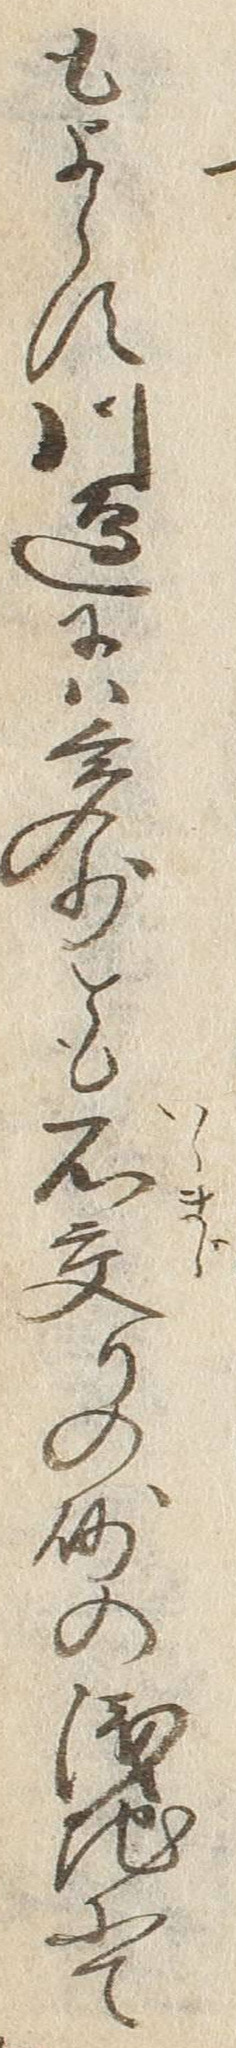もよら須川邊尓は多少とも石交りの砂の浅地尓て

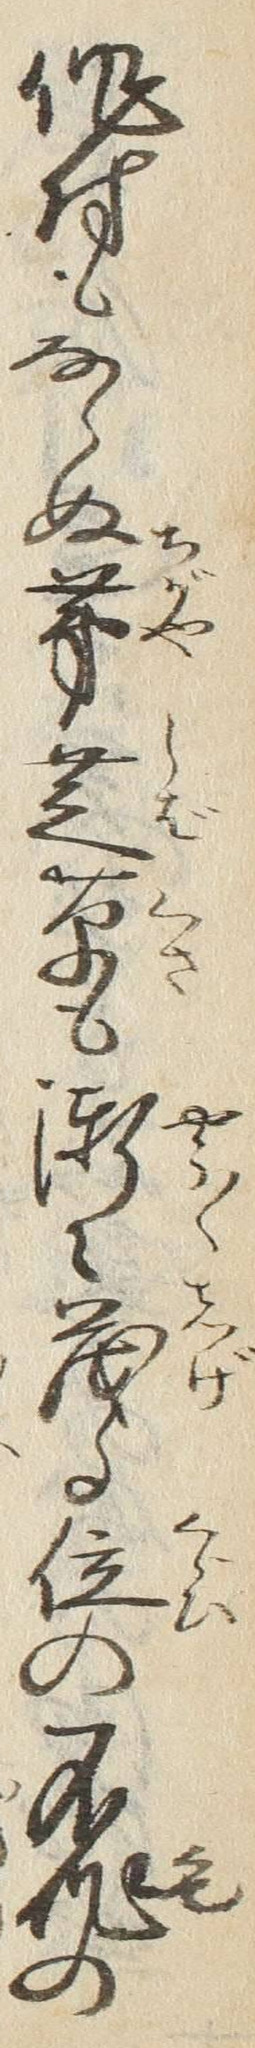作付もならぬ茅芝草も漸々茂る位の不作の
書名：養蠶實驗録後編
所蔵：東京大学農学生命科学図書館 国文学研究資料館
